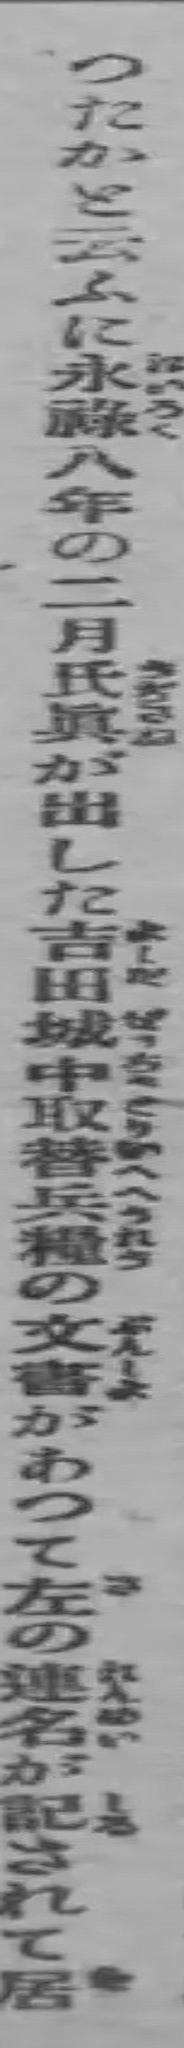つたかと云ふに永禄八年の二月氏真が出した吉田城中取替兵糧の文書があつて左の連名が記されて居
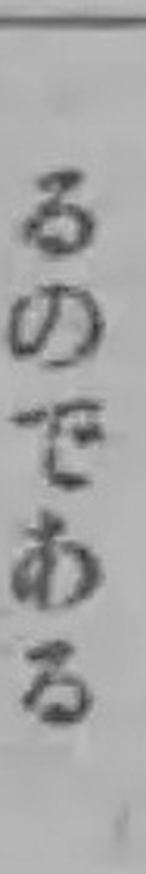るのである
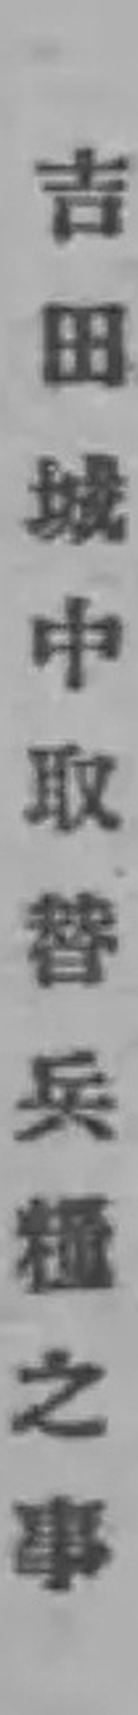吉田城中取替兵糧之事
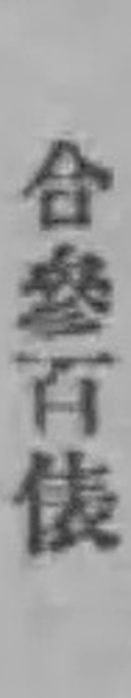合参百俵
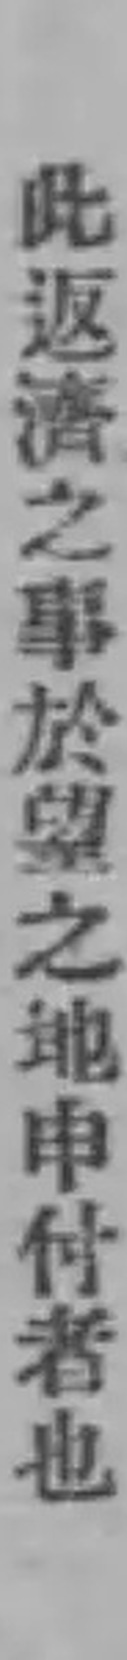此返済之事於望之地申付者也
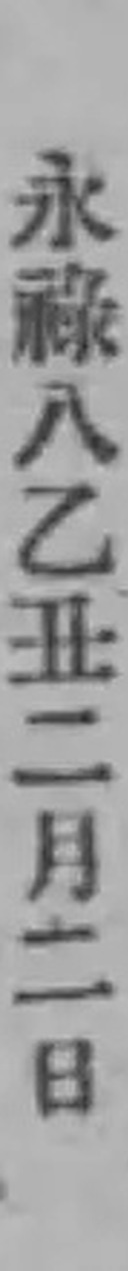永禄八乙丑二月二日
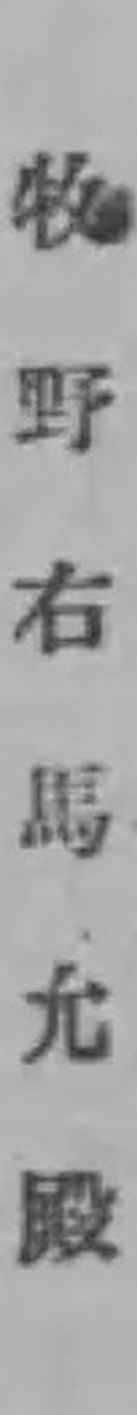牧野右馬允殿
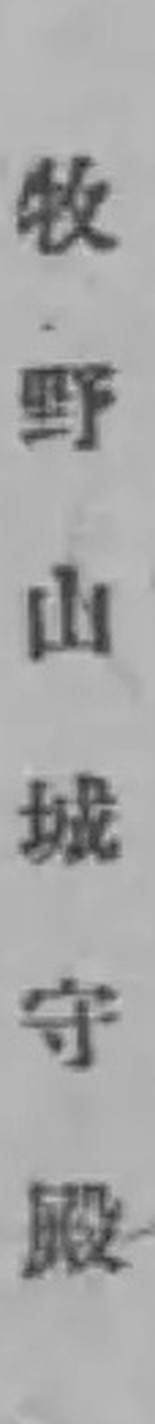牧野山城守殿
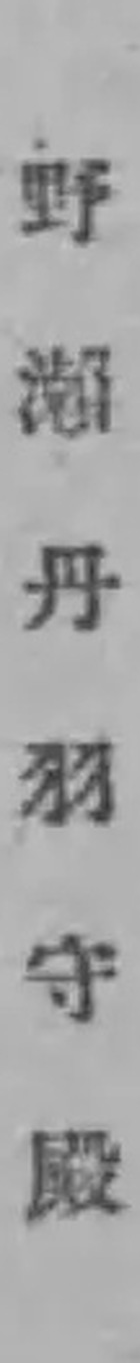野瀬丹羽守殿
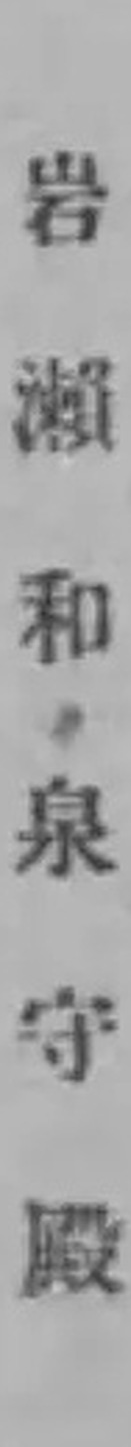岩瀬和泉守殿
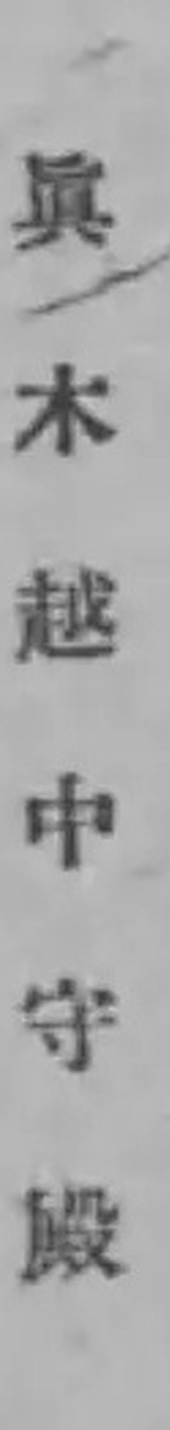眞木越中守殿
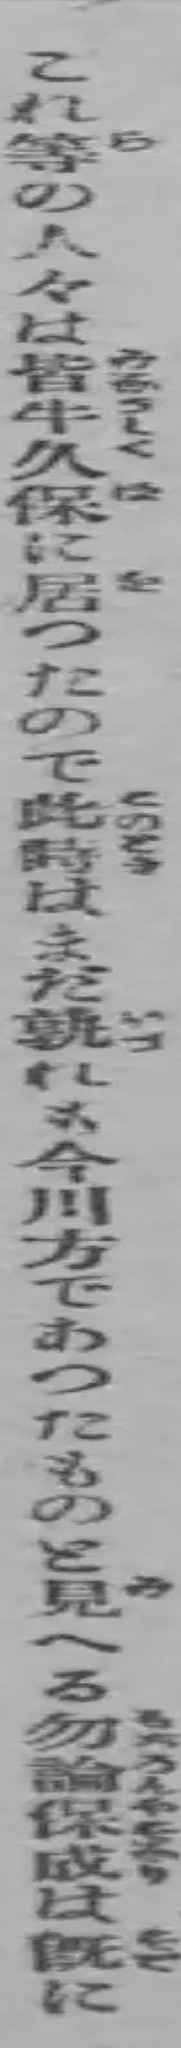これ等の人々は皆牛久保に居つたので此時はまだ孰れも今川方であつたものと見へる勿論保成は既に
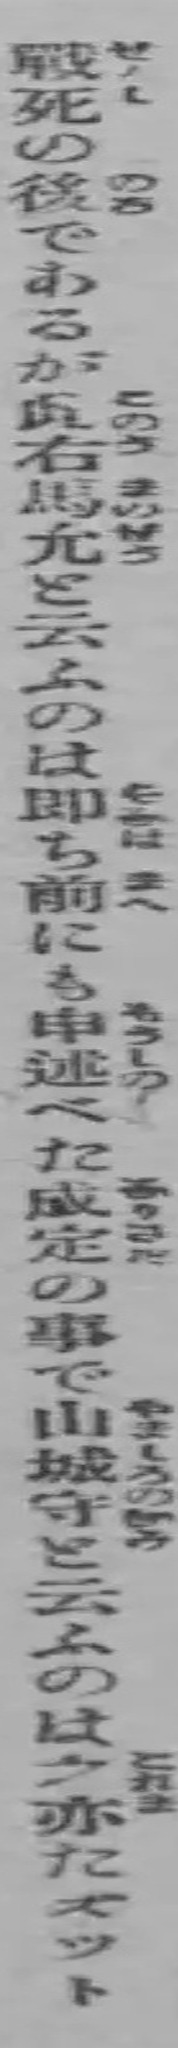戦死の後であるが此右馬允と云ふのは即ち前にも申述べた成定の事で山城守と云ふのは之亦たズツト
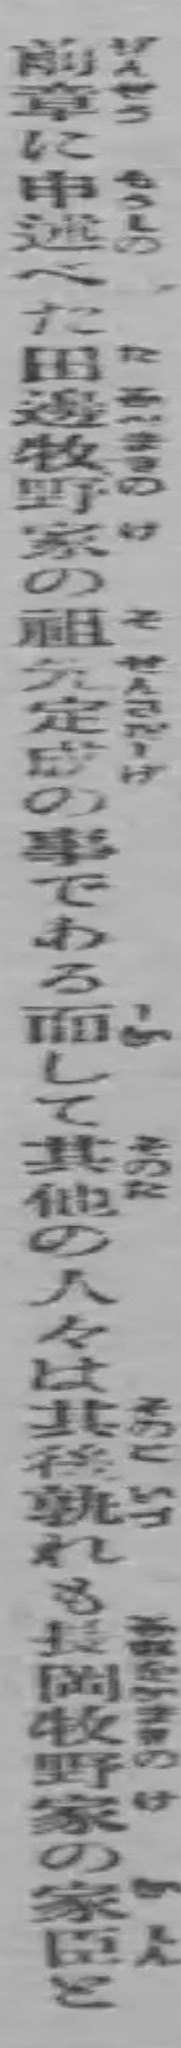前章に申述べた田邉牧野家の祖先定成の事である而して其他の人々は其後孰れも長岡牧野家の家臣と
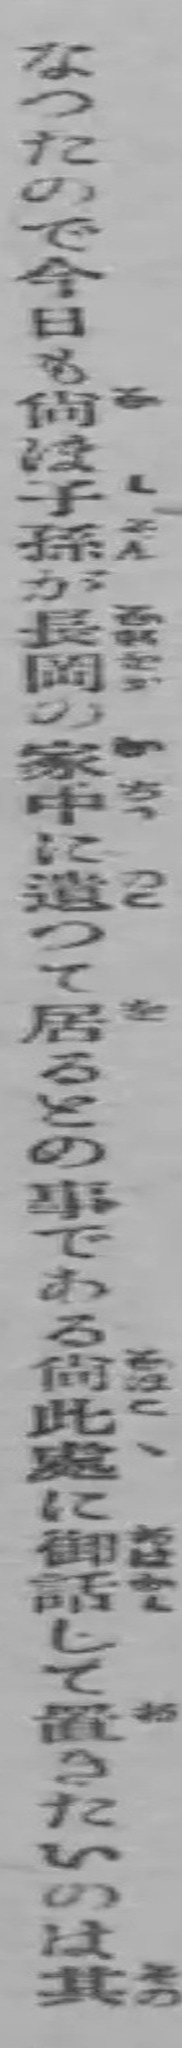なつたので今日も尚ほ子孫が長岡の家中に遺つて居るとの事である尚此処に御話して置きたいのは其
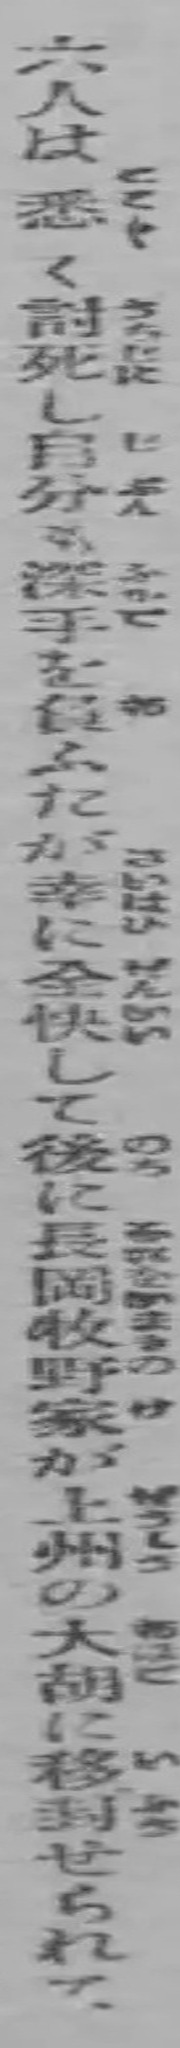六人は悉く討死し自分も深手を負ふたが幸に全快して後に長岡牧野家が上州の大胡に移封せられて
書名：豊橋市史談
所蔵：国立国会図書館 National Diet Library, JAPAN
